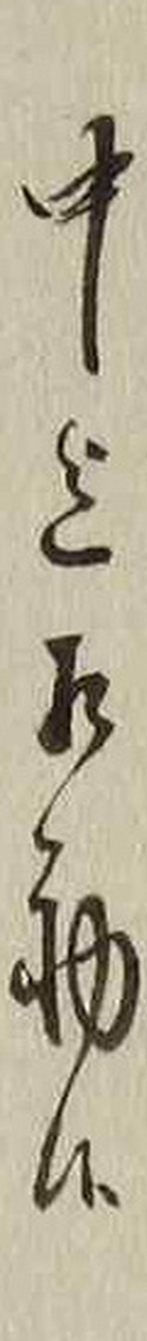中迄相勤候
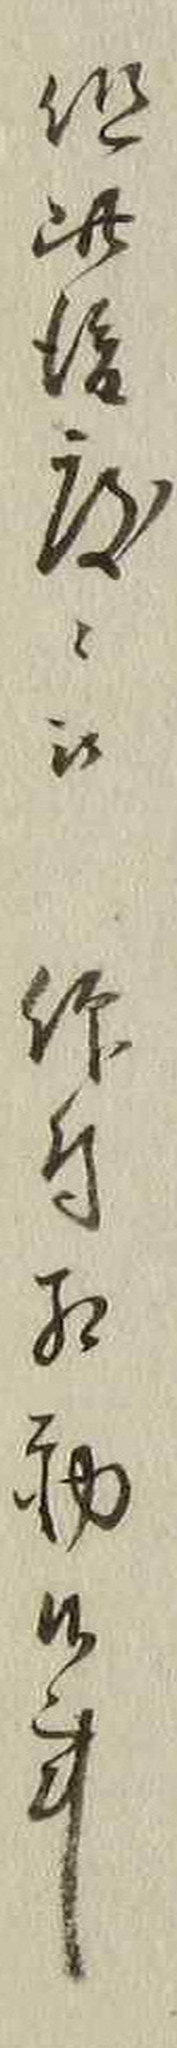但此後度々被仰付相勤候事
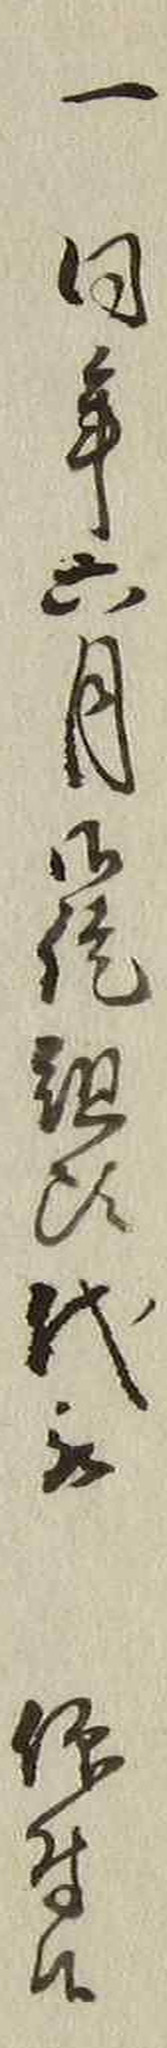一同年六月御徒組頭代被仰付候
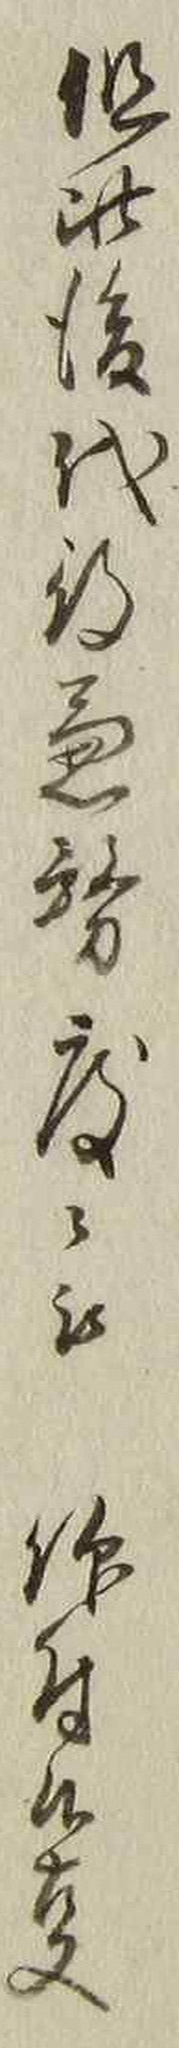但此後代役兼務度々被仰付候事
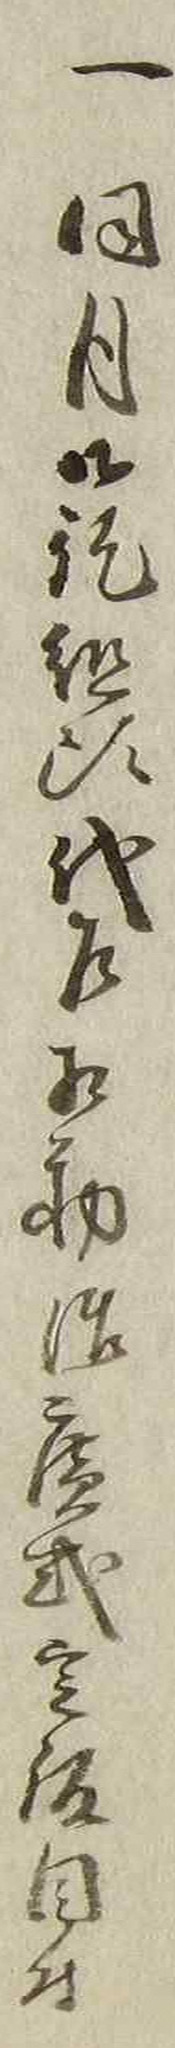一同月御徒組頭代乍相勤御広式定仮目付
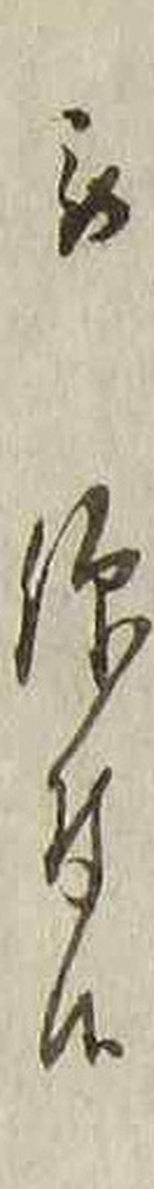被仰付候
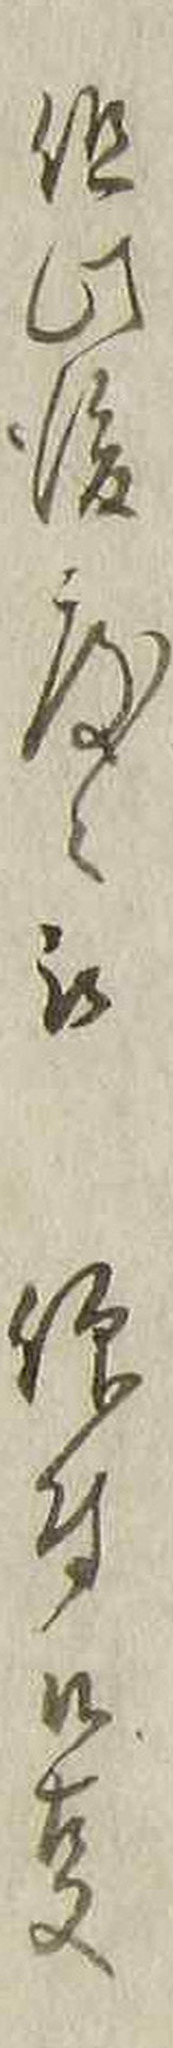但此後度々被仰付候事
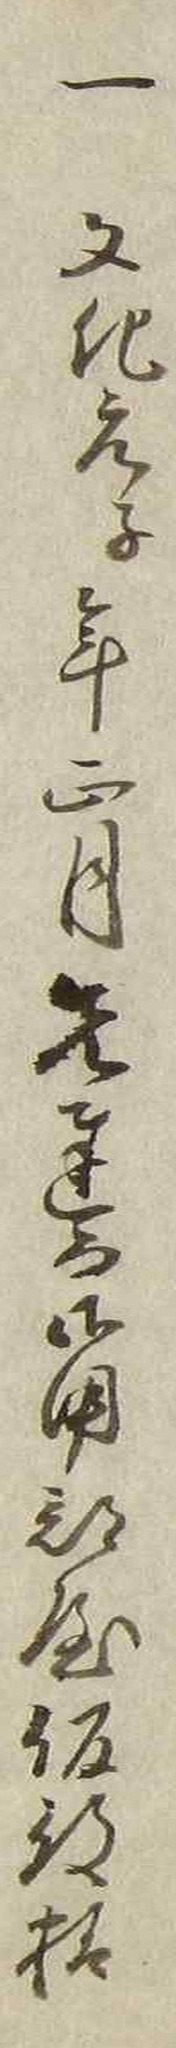一文化元子年正月先達而御用部屋仮役精
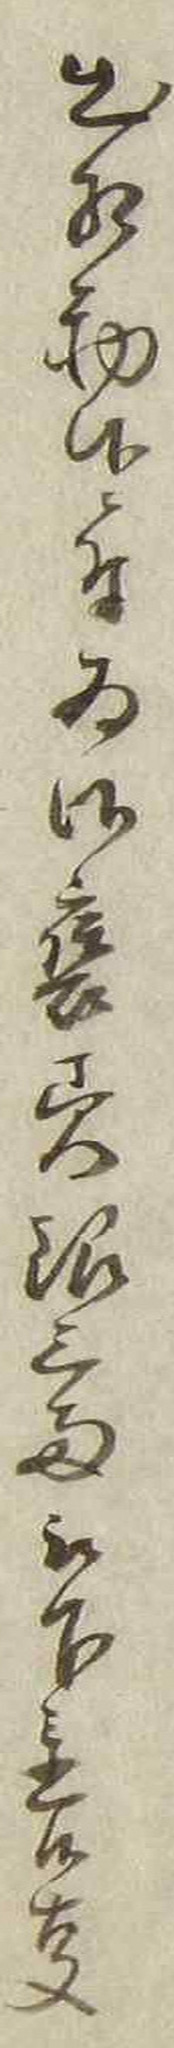出相勤候ニ付為御褒美銀三両被下置候事

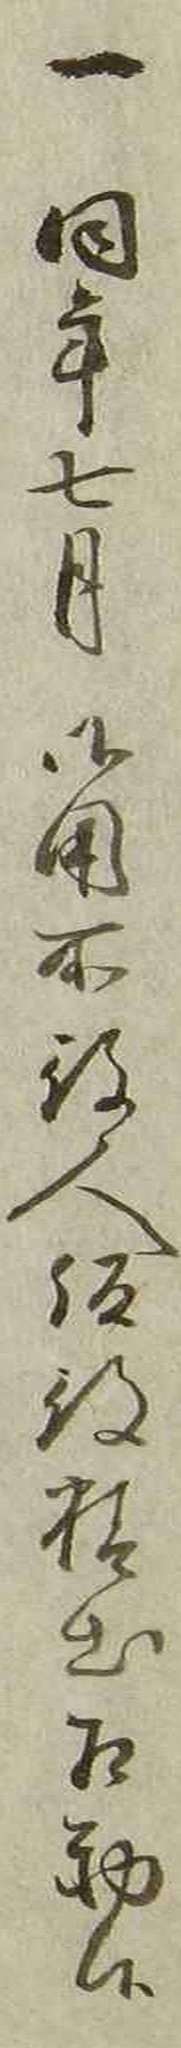一同年七月御用所役人仮役精出相勤候
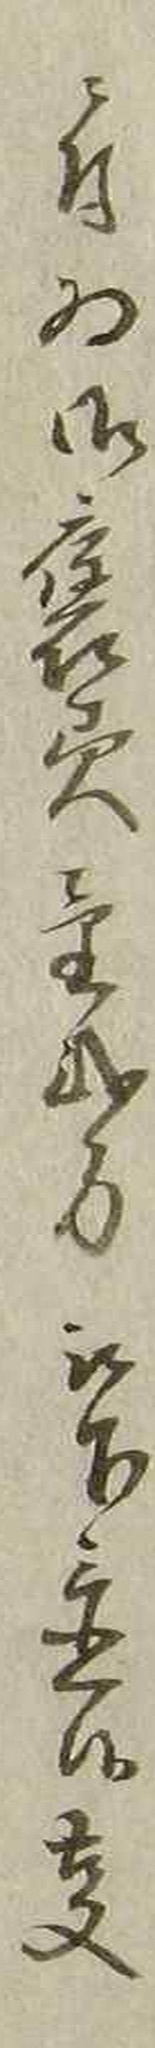ニ付為御褒美金弐分被下置候事
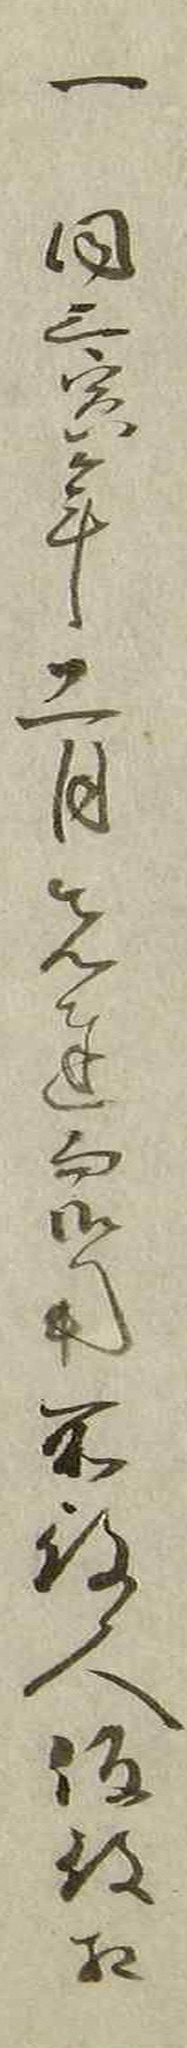一同三寅年十一月先達而御用所役人仮役相
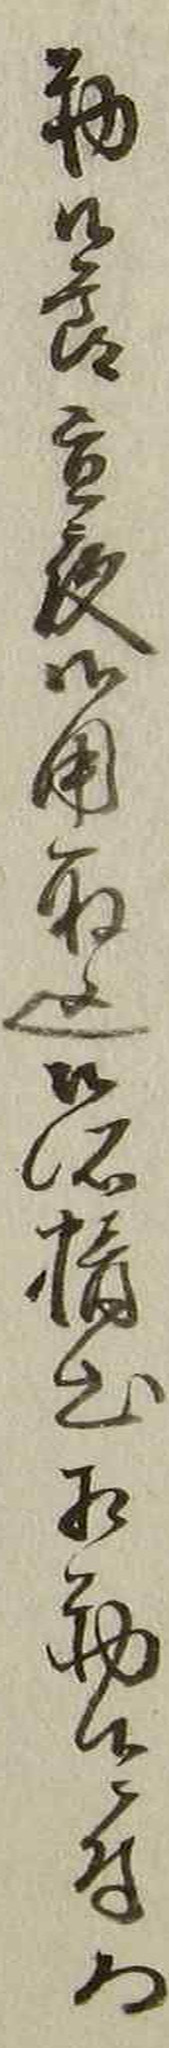勤候節昼夜御用取込候所精出相勤候ニ付為
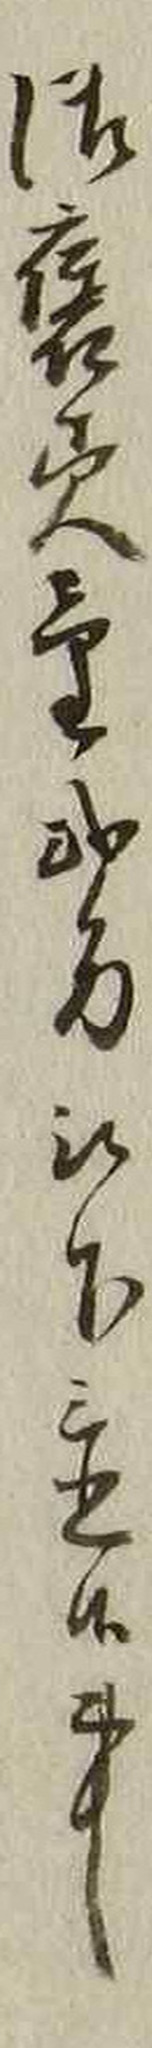御褒美金弐分被下置候事
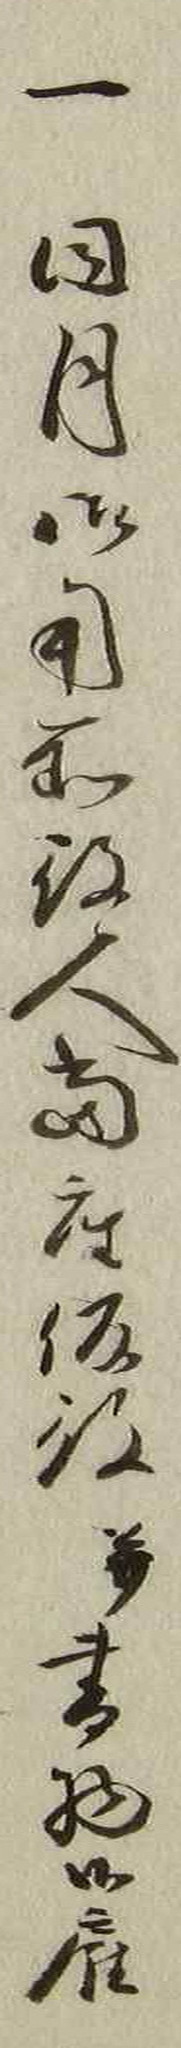一同月御用所役人当座仮役并書物御雇
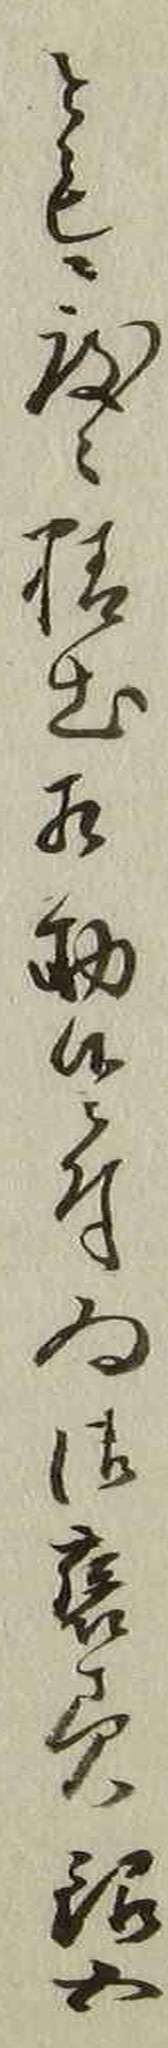ともニ度々精出相勤候ニ付為御褒美銀五
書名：諸士系譜　巻之132　た之部8
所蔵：会津若松市立会津図書館
